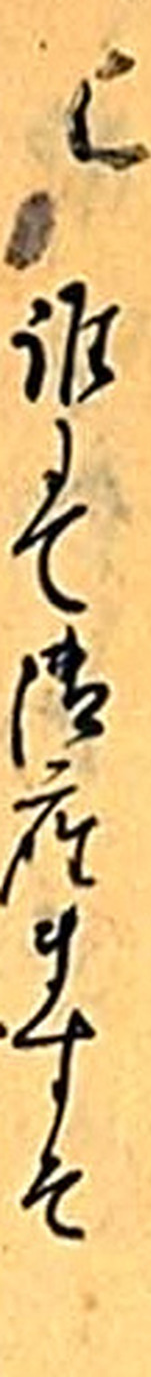誰にて御座ますそ
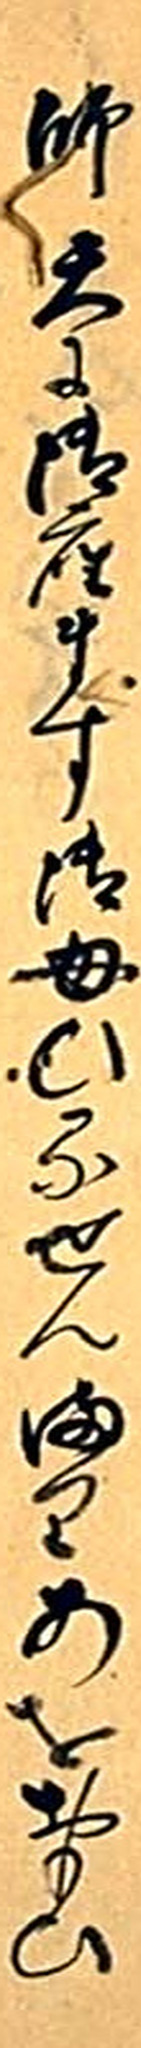師天に御座ます御母ひるせんまりあをおもひ
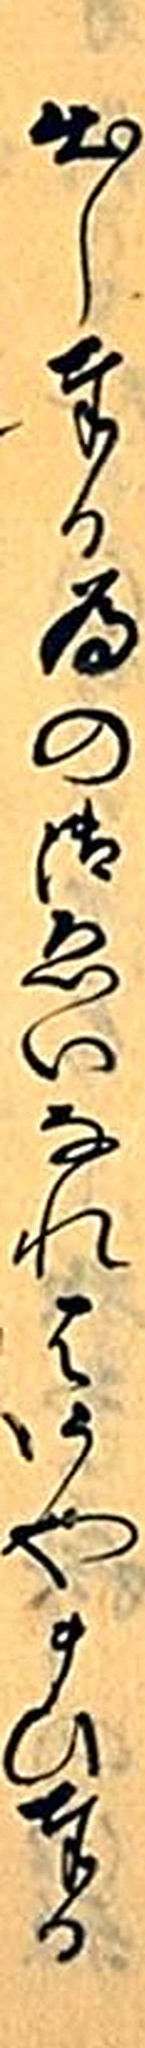出し奉る為の御ゑいなれはうやまひ奉る
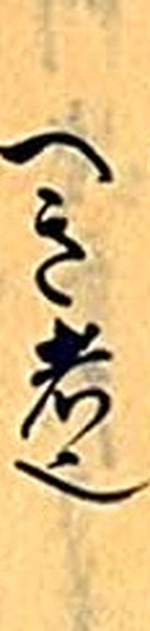へき者也
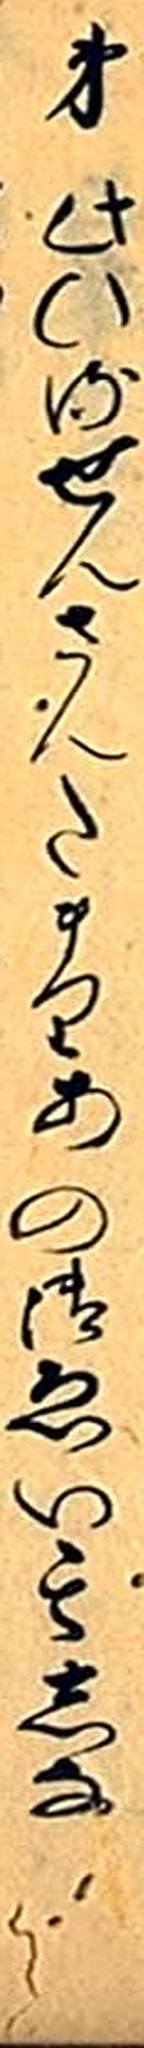弟此ひるせんさんたまりあの御ゑい其しな
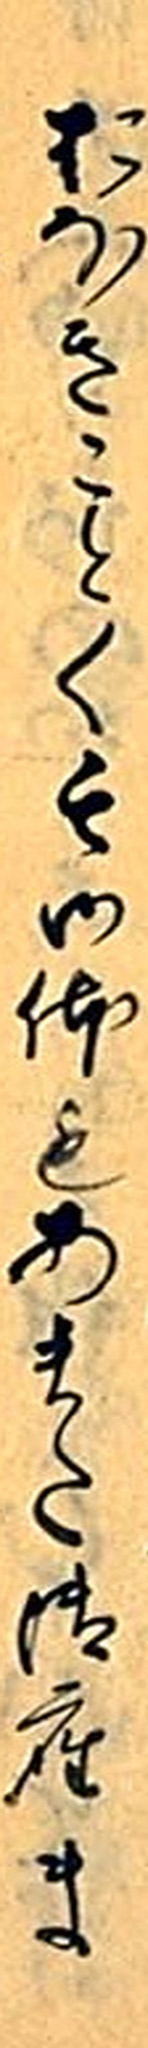おほきことく其御体もあまた御座ま
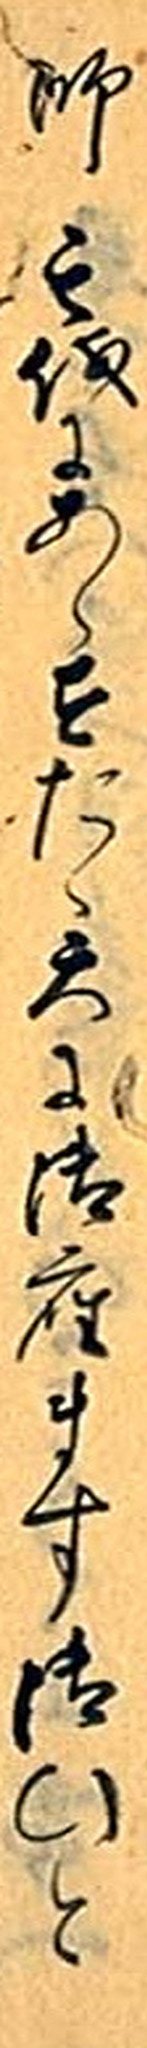師其儀にあらすたゝ天に御座ます御ひと
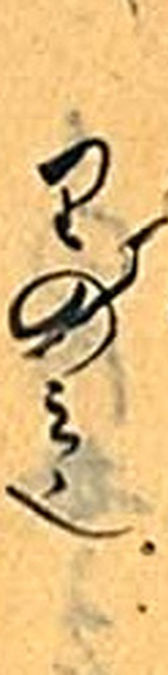りのみ也
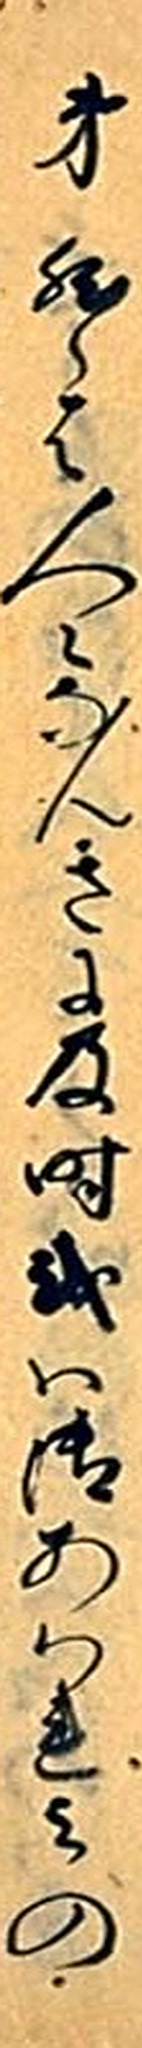弟然らは人々なんきに及時或は御あはれみの
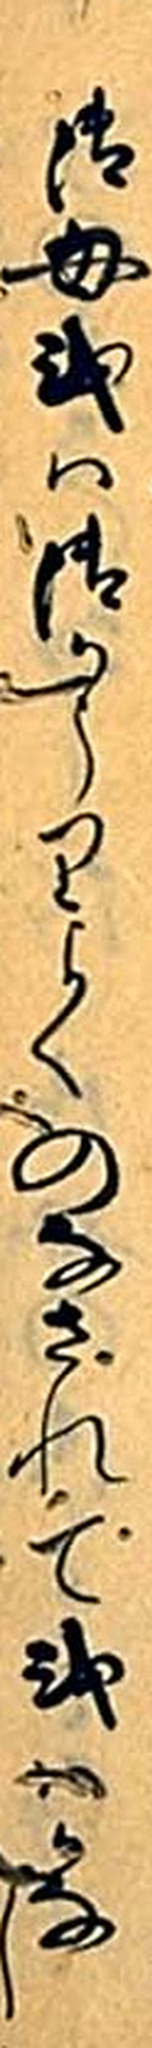御母或は御かうりよくのなされて或はかなし
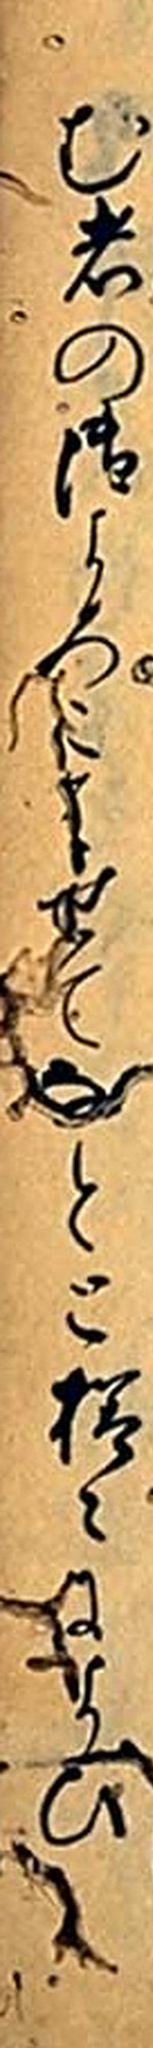む者の御よろこせてなとと様々によひ

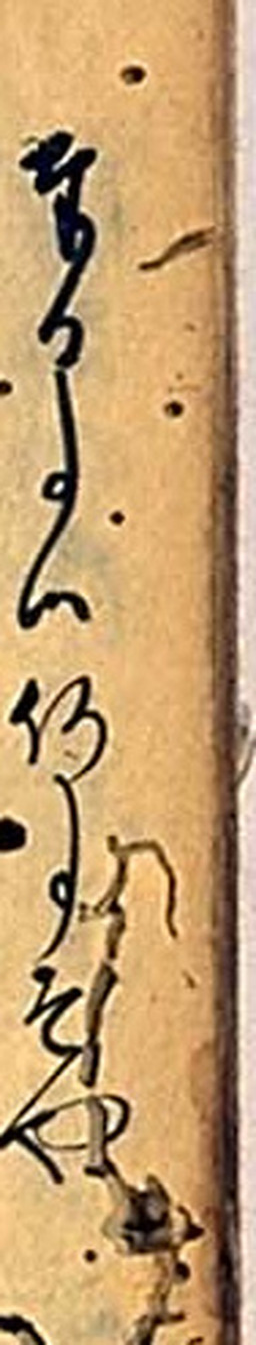奉る事は何事そや
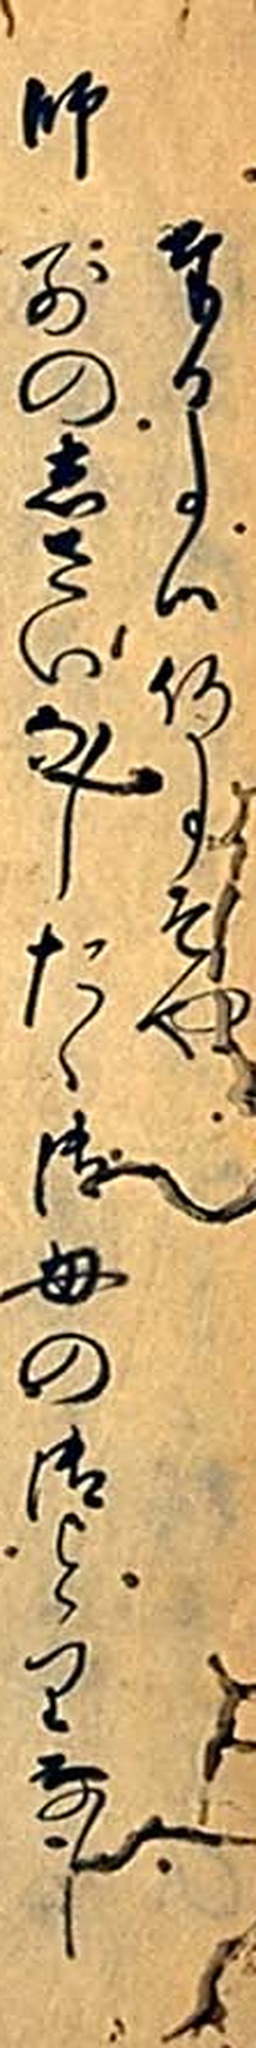師別のしさいなしたゝ御母の御とりなし
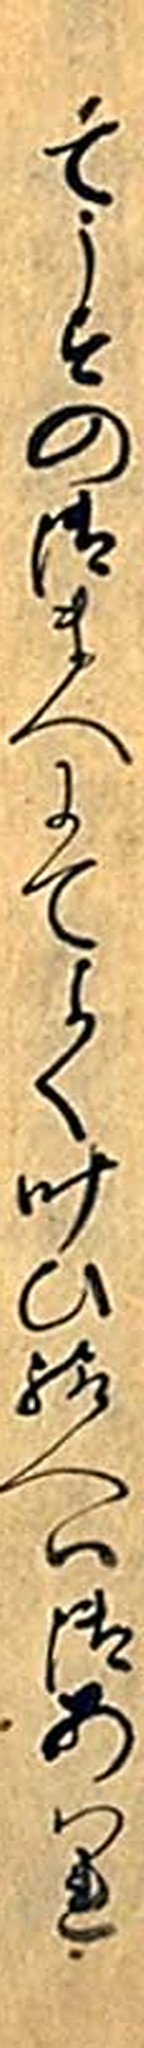てうすの御まへにてよく叶ひ給へは御あはれ
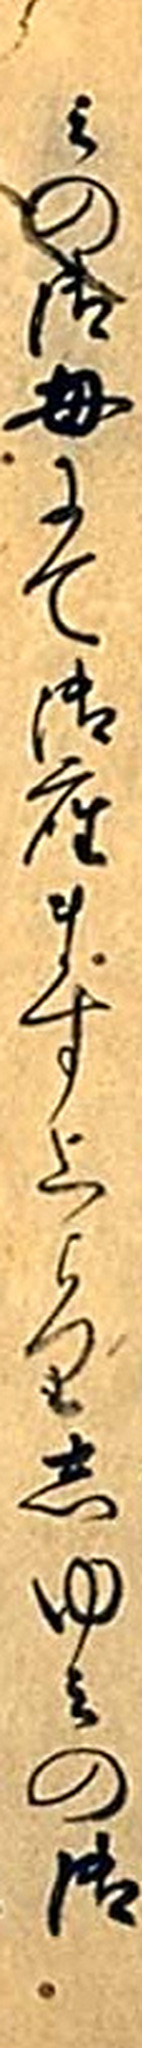みの御母にて御座ます上よりしゆみの御
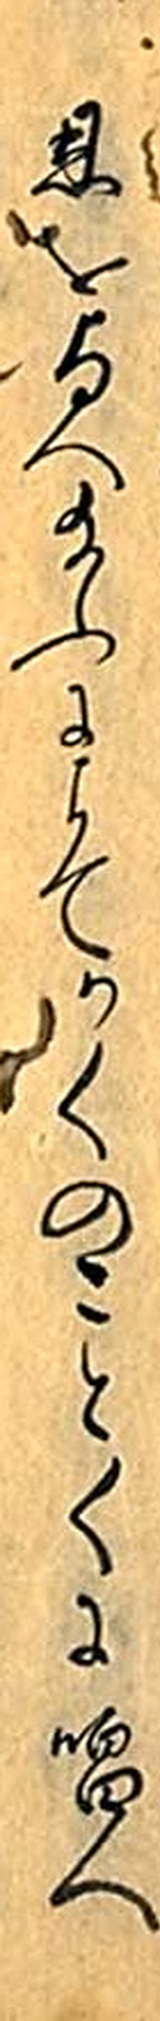恩を与へ給ふによてかくのことくに唱へ
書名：ドチリナ・キリシタン
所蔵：東京大学総合図書館 / General Library in the University of Tokyo
